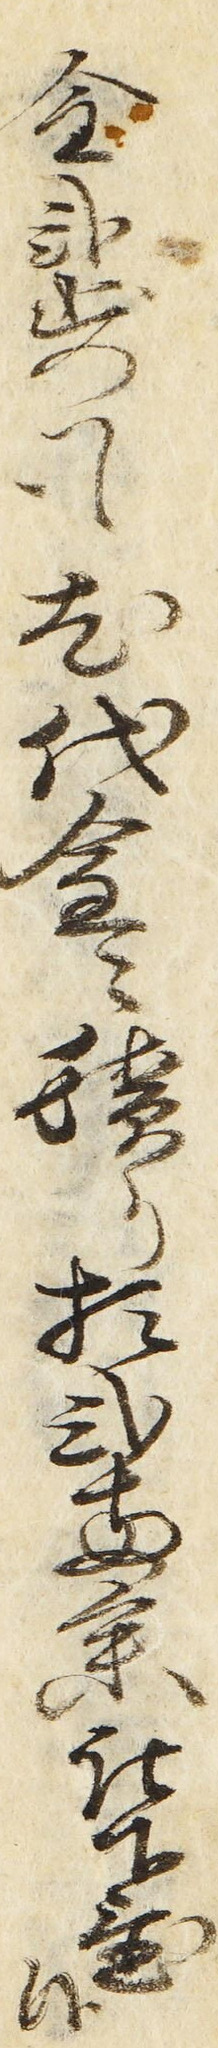金弐歩ツヽ尤代金ニ積り拾弐両参被下置候
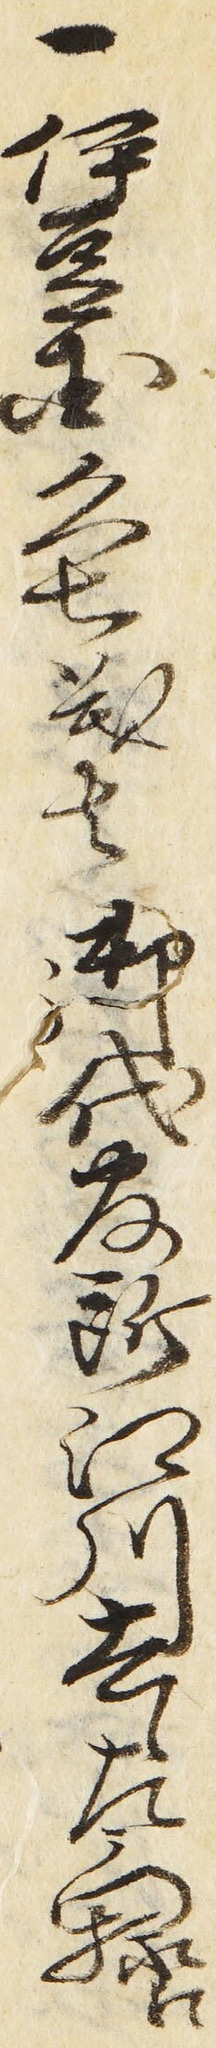一伊豆国久七義者御代官所江川太郎左衛門様江
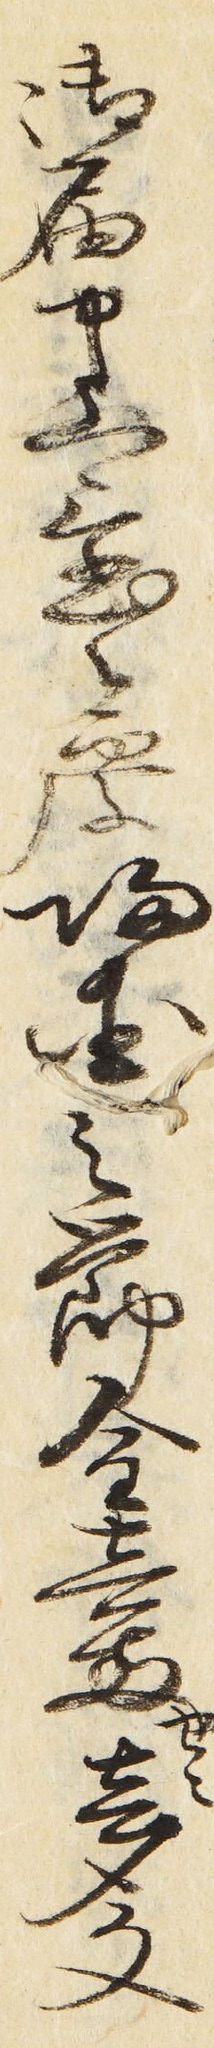御届申上置候処帰国之節金壱両ゼニ壱貫文
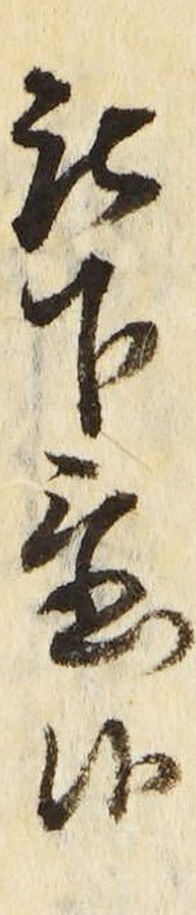被下置候
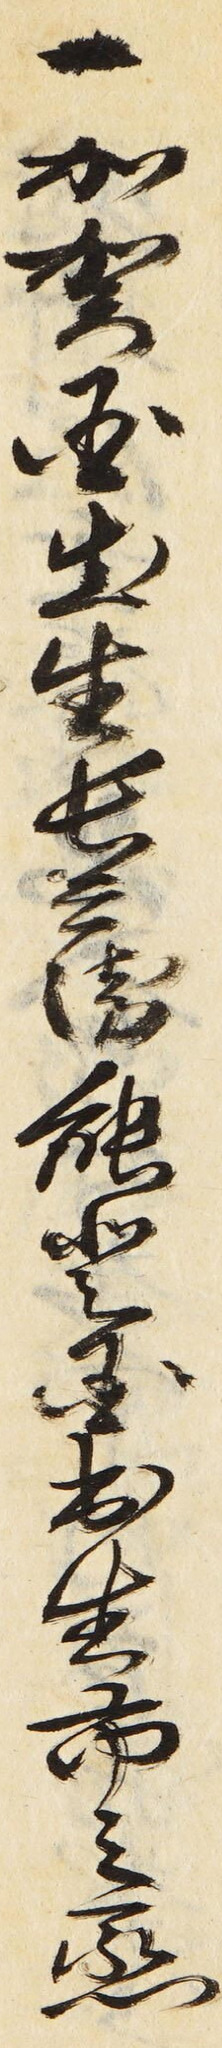一加賀国出生長兵衛能登国出生市之丞
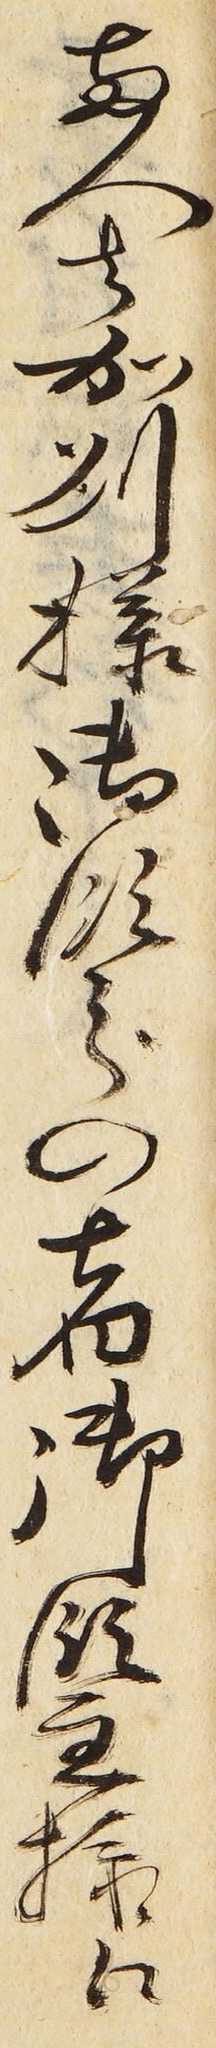両人者加州様御領分の者御領主様江
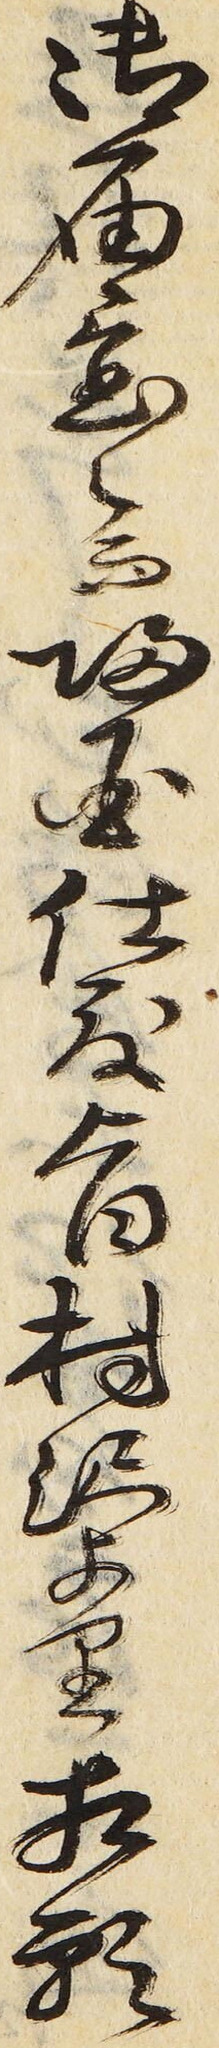御届置候而帰国仕度旨村沢より相願
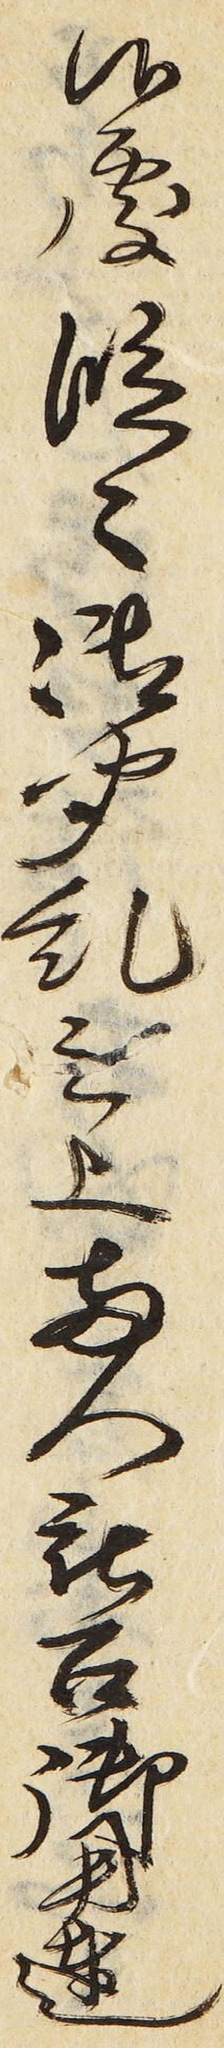候処段々御聞糺之上両人被召御用達
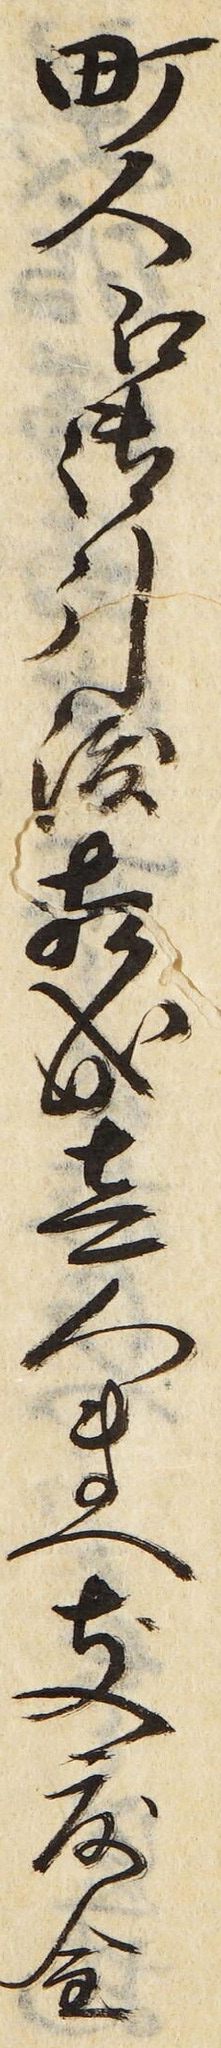町人江御引渡相成壱人まへ支度金
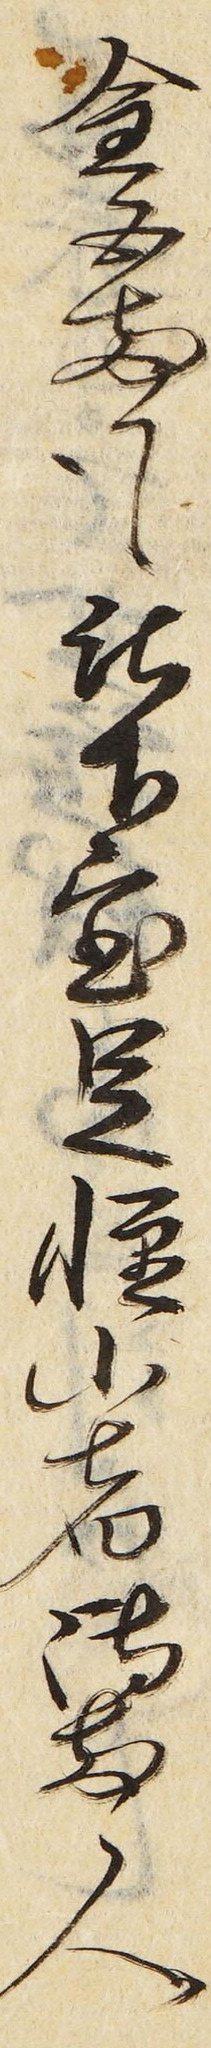金五両ツヽ被下置足軽小者御両人
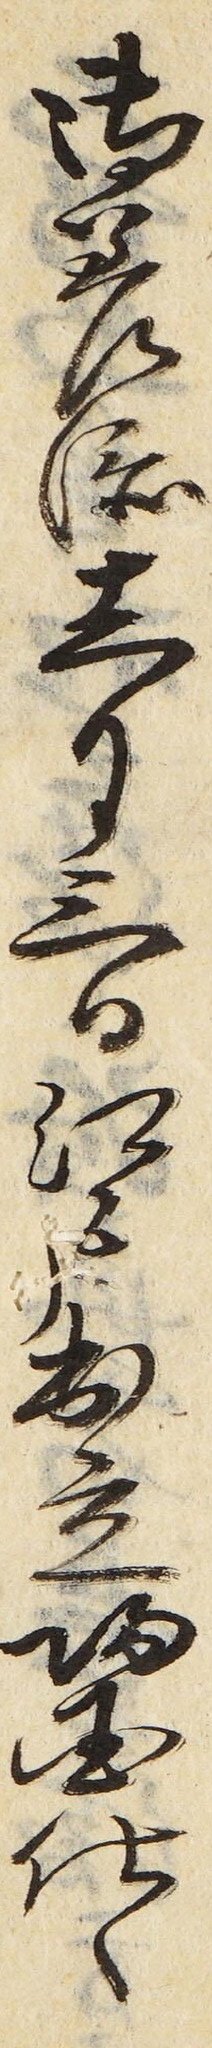御差添十二月三日江戸出立帰国仕候
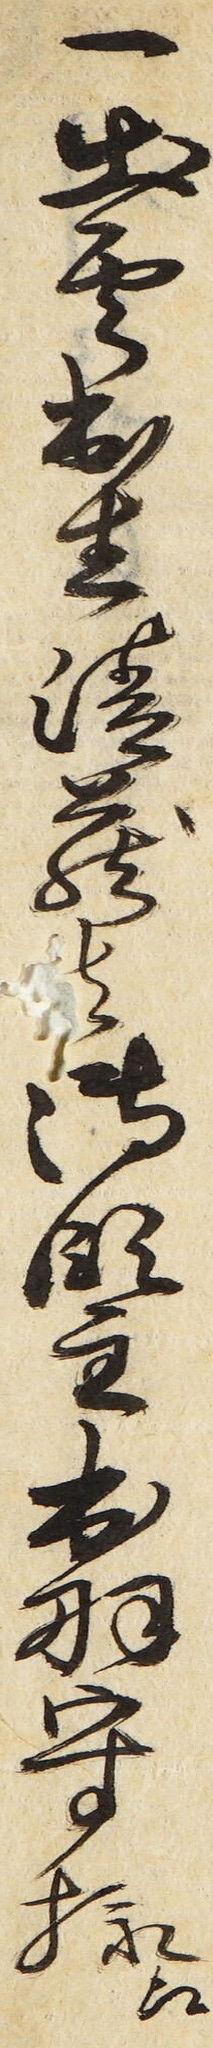一出雲出生清蔵者御領主出羽守様江

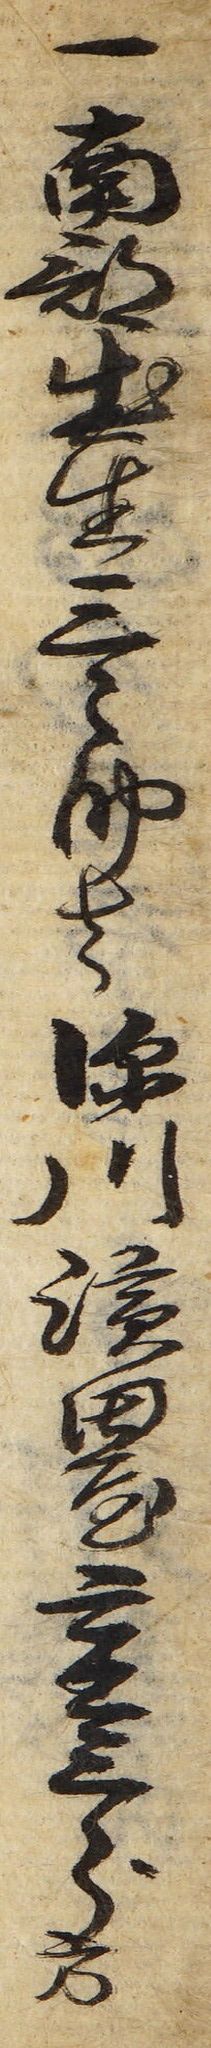一南部出生三之助者深川浜田屋重三郎方
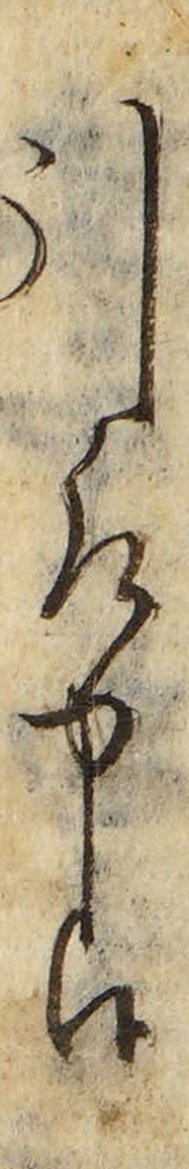引取申候
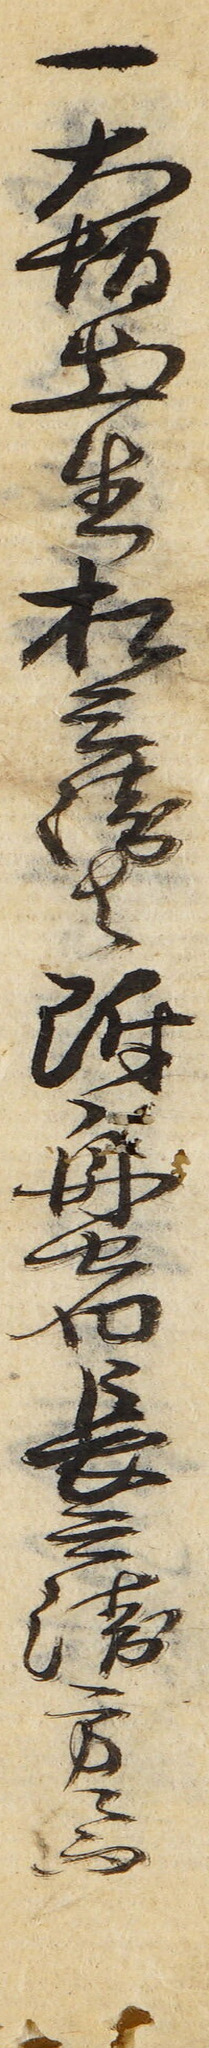一大坂出生松兵衛者付舟宿長兵衛方ニ而
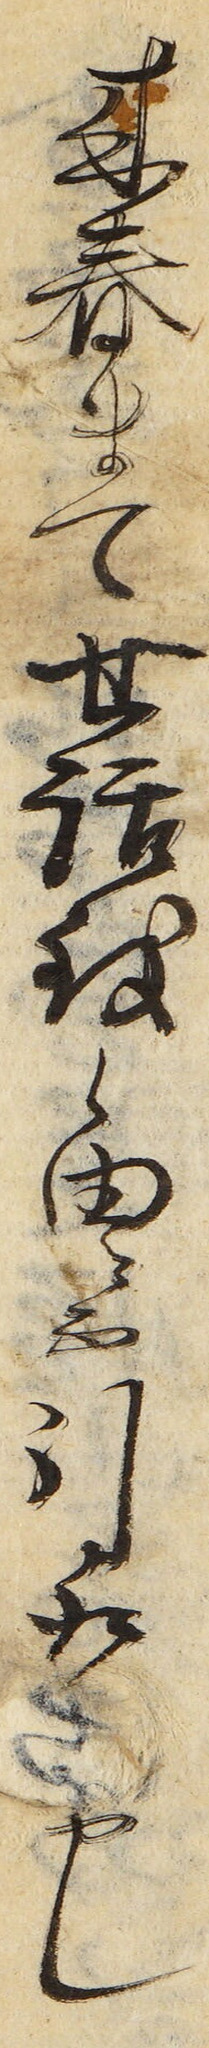来春まて世話致候由ニ而引取申候
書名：漂流一件上書
